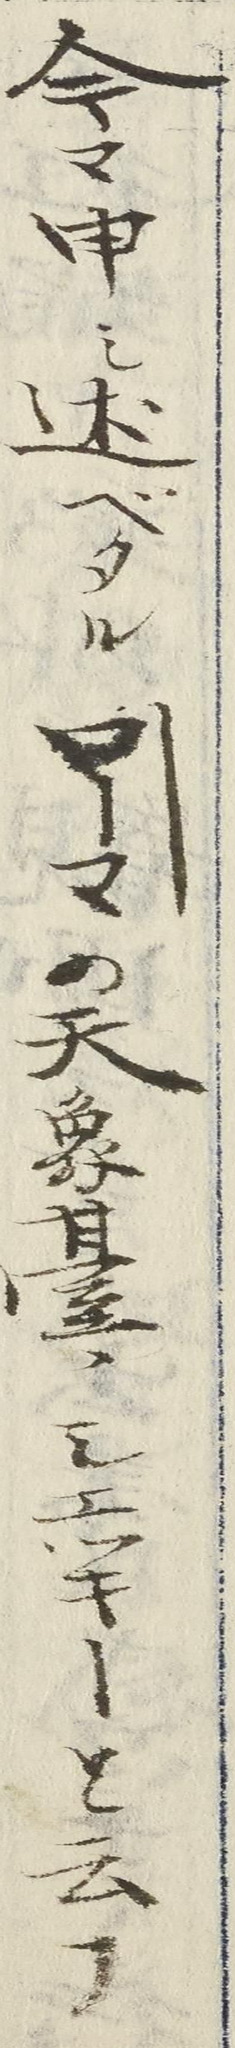今マ申し述べタルローマノ天象台ノシエッキ―と云う
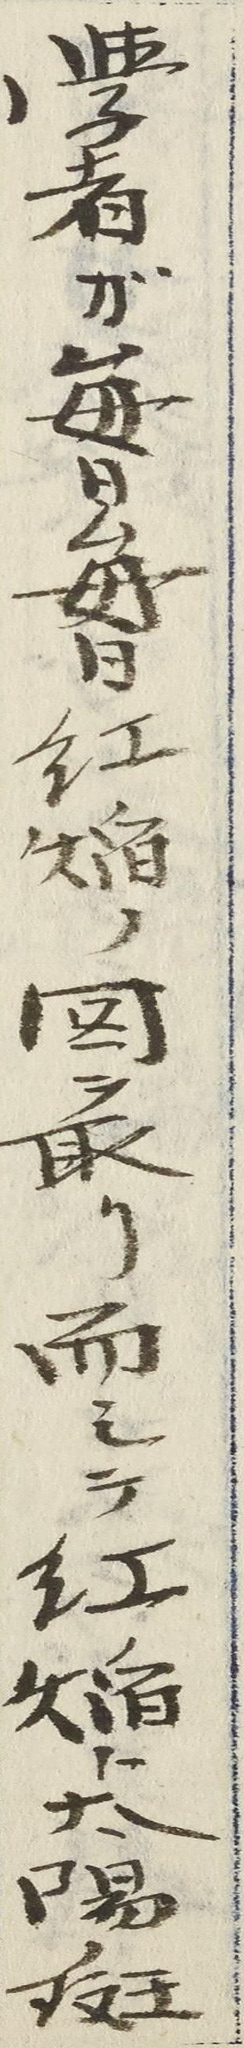学者ガ毎日毎日紅焔ノ図ヲ取り而シテ紅焔ㇳ太陽ノ斑点
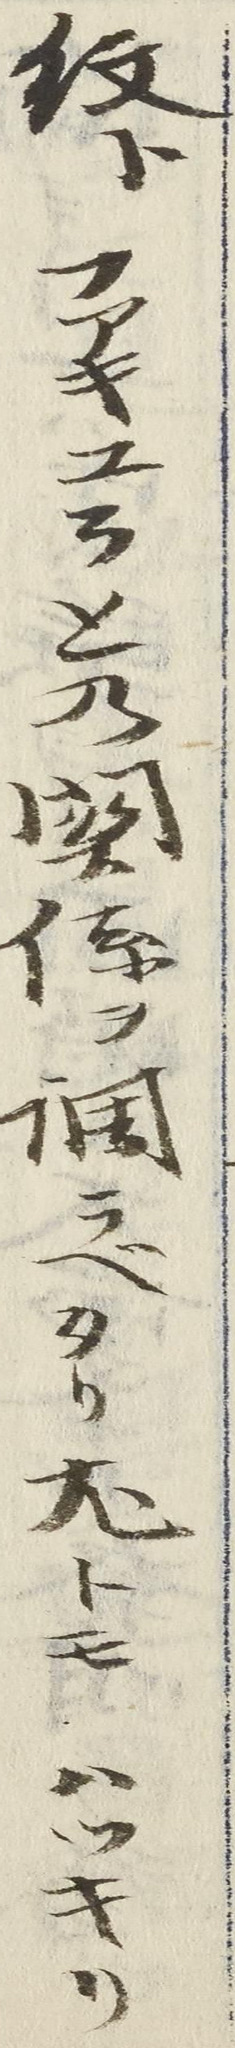紋ㇳフアキユラとの関係ヲ調べタリ尤トモハッキリ
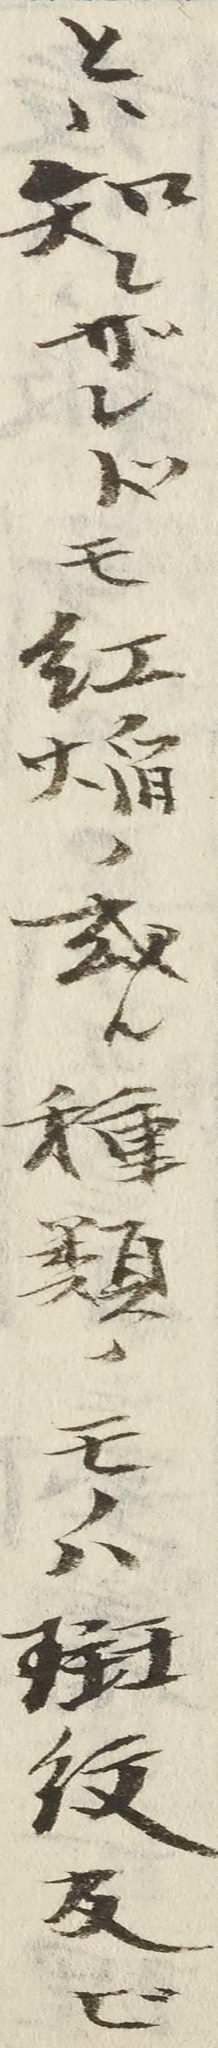とハ知レザレドモ紅焔ノ或ㇽ種類ノモノハ斑紋及ビ
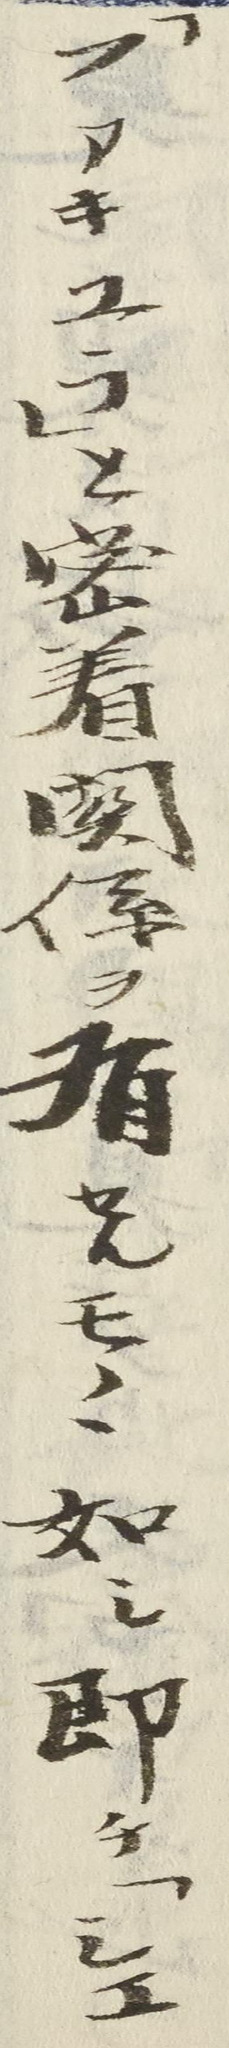「フアキユラ」と密着関係ヲ有センモノゝ如シ即チ「シエ
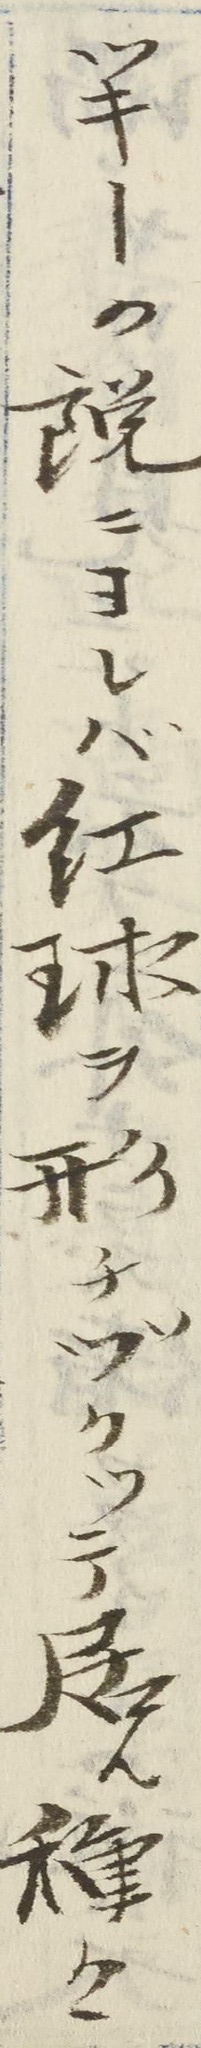ッキ―の説二ヨレバ紅球ヲ形チヅクッテ居ㇽ種々
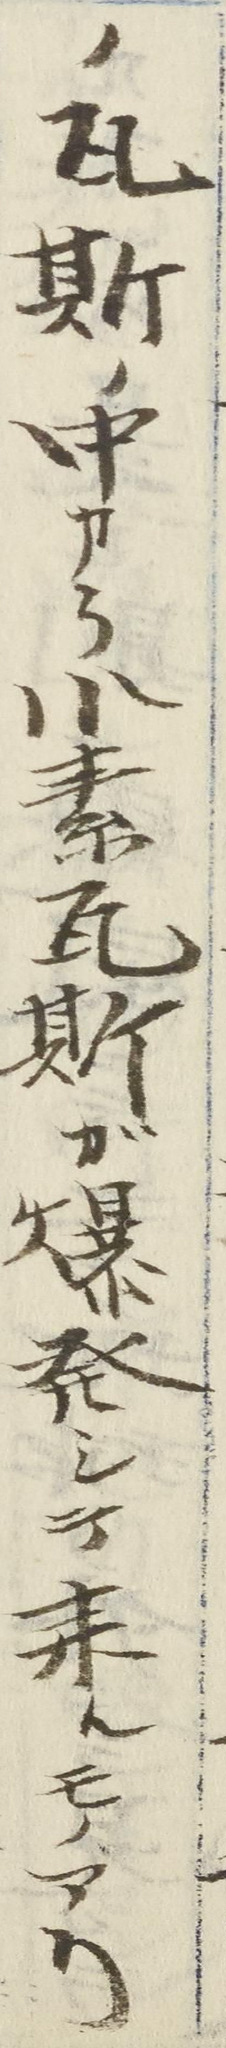ノ瓦斯ノ中カラ水素瓦斯ガ爆発シテ来ㇽモノアリ
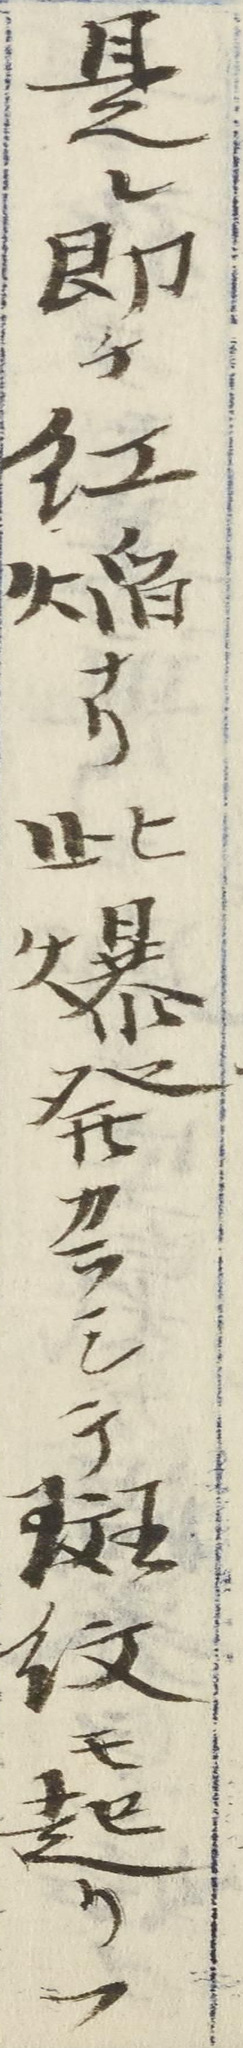是レ即チ紅焔ナリ此爆発カラシテ斑紋モ起リフ
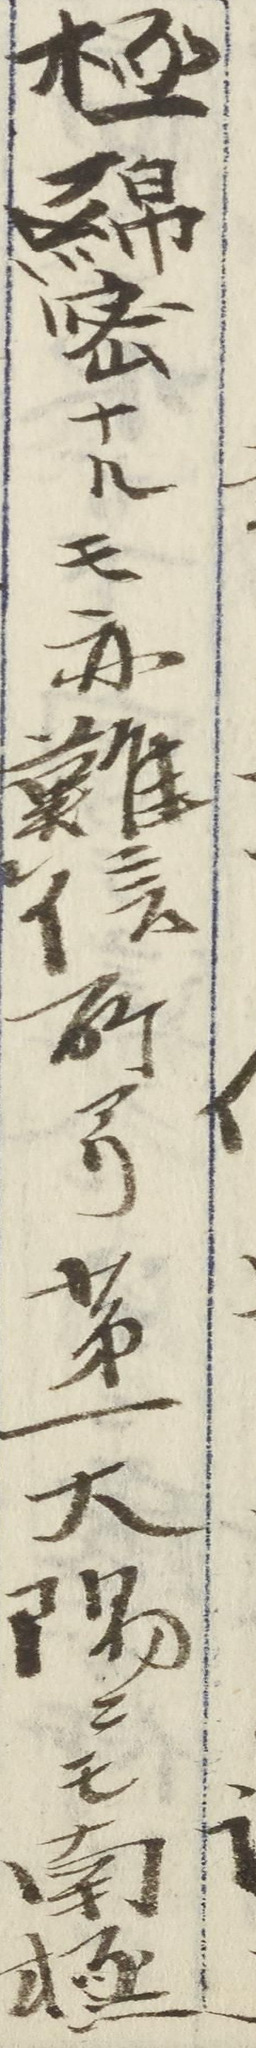極綿密ナルモ亦難信所アリ第一太陽二モ南極
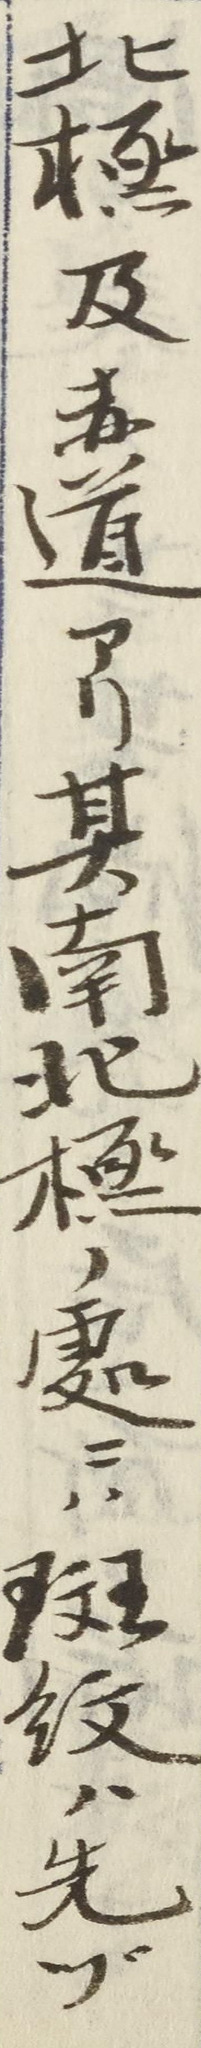北極及赤道アリ其南北極ノ処二ハ斑紋ハ先ヅ
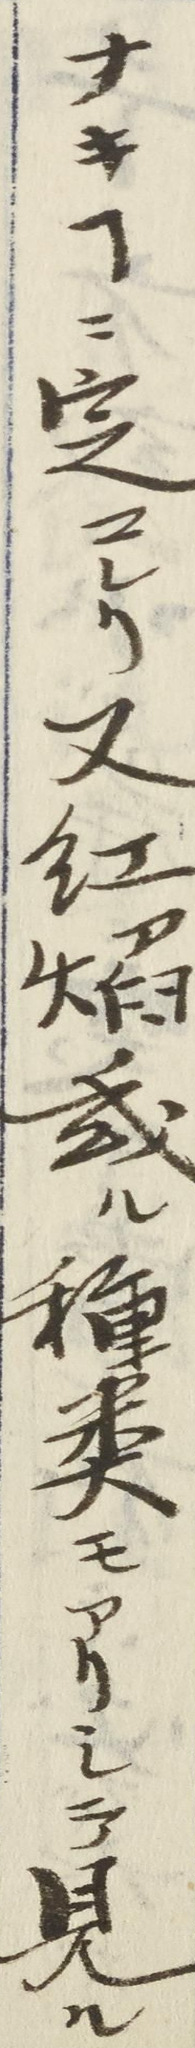ナキコト二定マレり又紅焔ノ或ㇽ種類モアリシテ見ㇽ
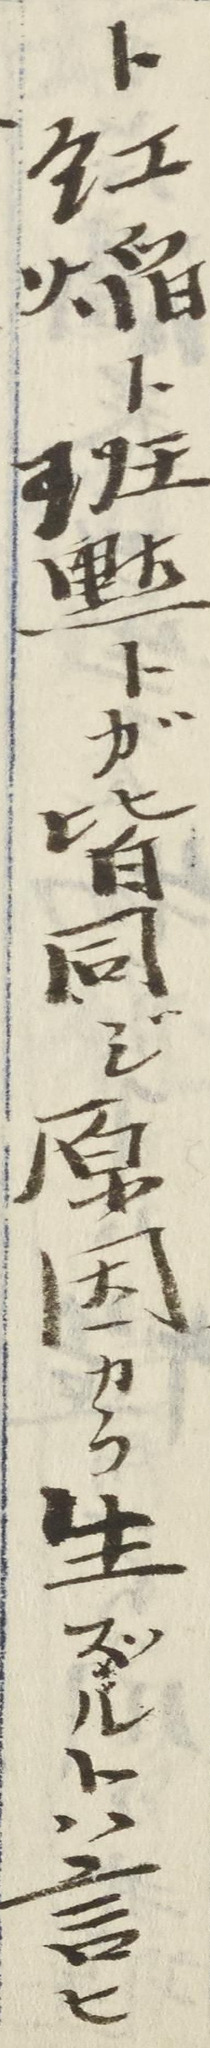ト紅焔ㇳ斑点トガ皆同ジ原因カラ生ズルトハ言ヒ
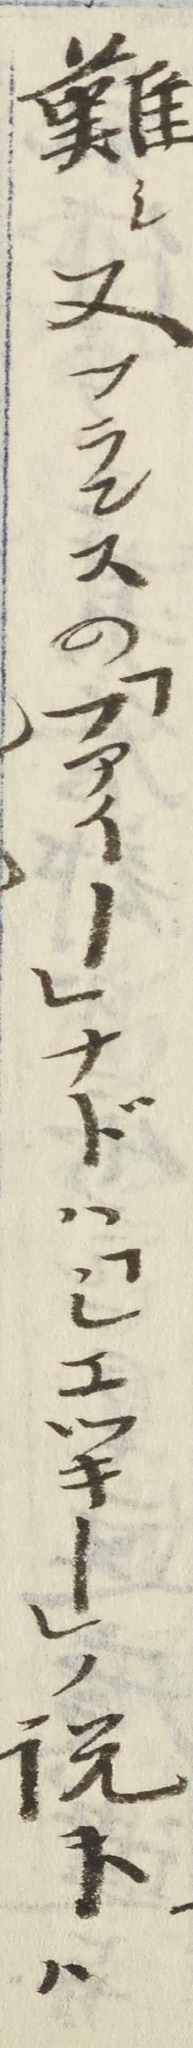難シ又フランスの「フアイー」ナドハ「シエツキ―」ノ説ㇳハ
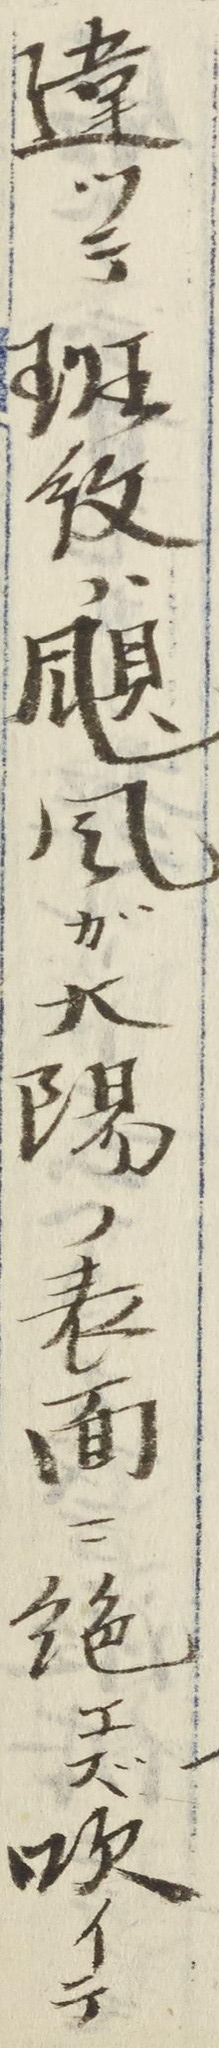違ッテ斑紋ハ颶風ガ太陽ノ表面二絶エㇲ吹イテ

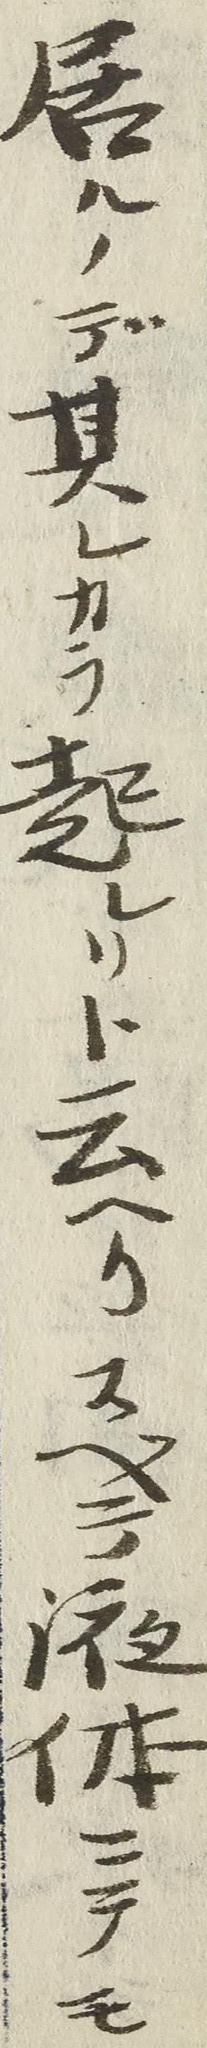居ㇽノデ其レカラ起レリト云ヘリスベテ液体二テモ
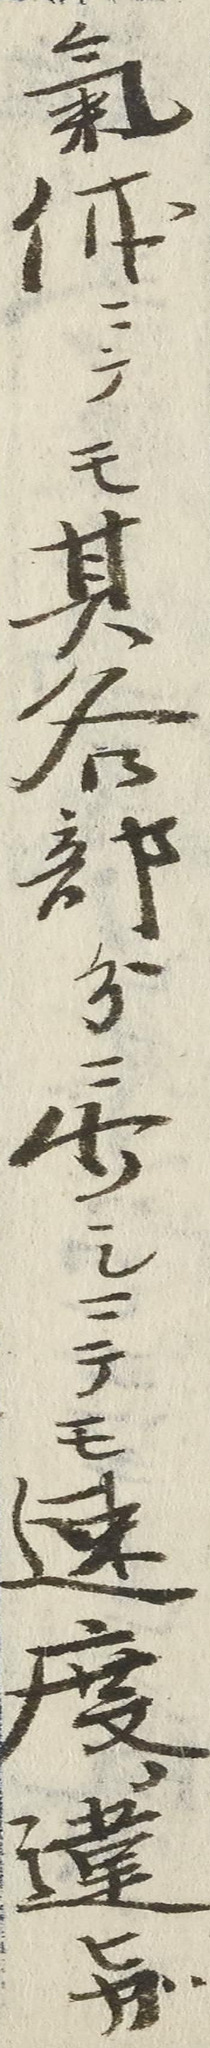気体二テモ其格部分二少シ二テモ速度ノ違ヒガ
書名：日蝕録　全
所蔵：東京大学地震研究所図書室 Earthquake Research Institute Library, The University of Tokyo, JAPAN
